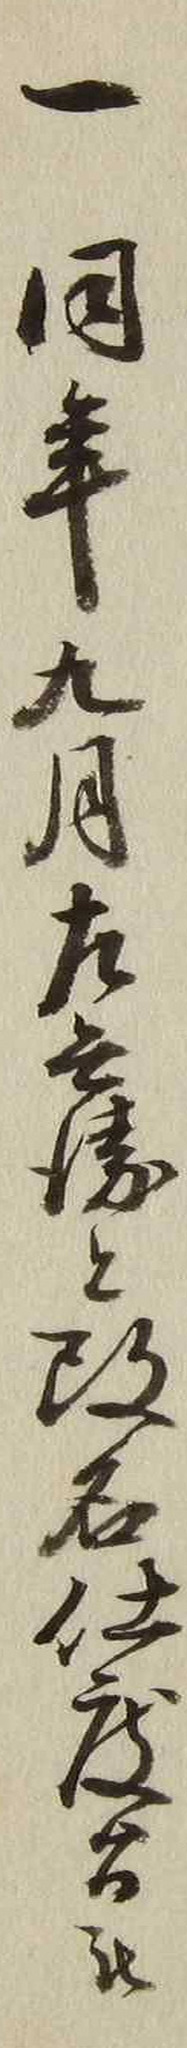一同年九月左兵衛と改名仕度旨被
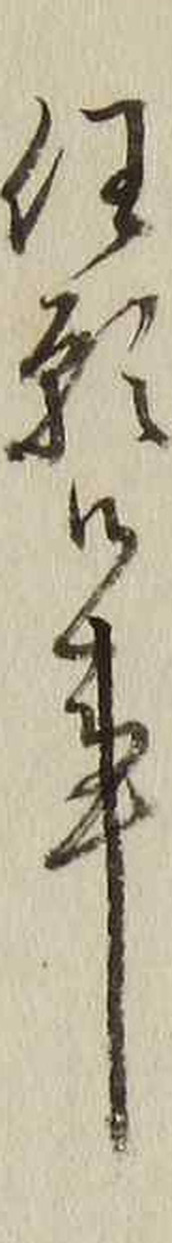任願候事
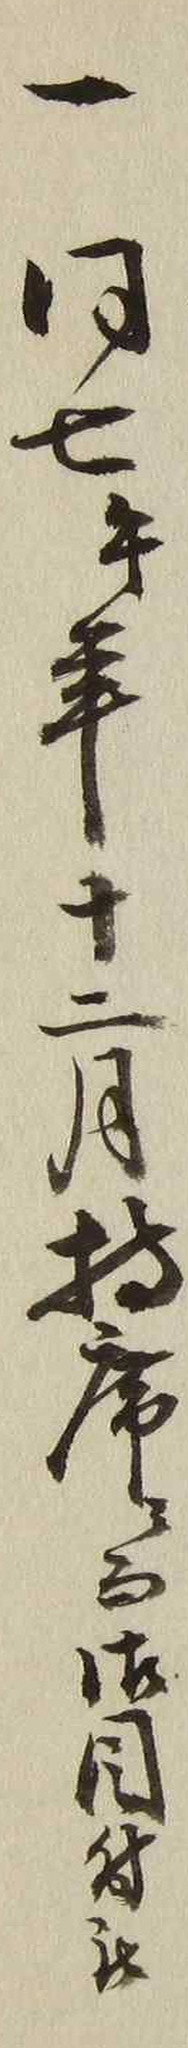一同七午年十二月持席ニ而御目付被
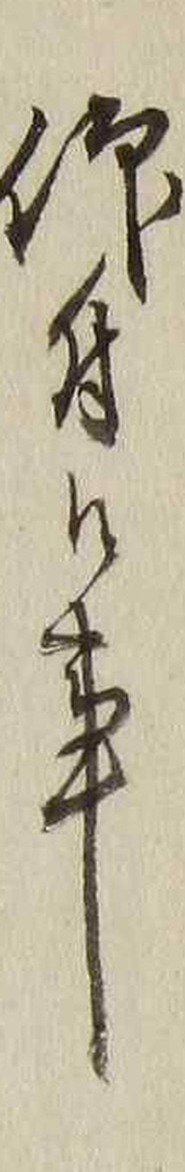仰付候事
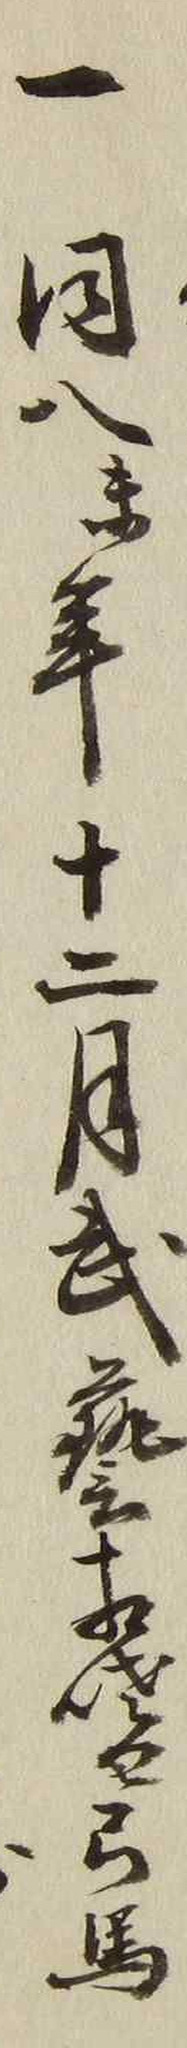一同八未年十二月武芸相嗜弓馬
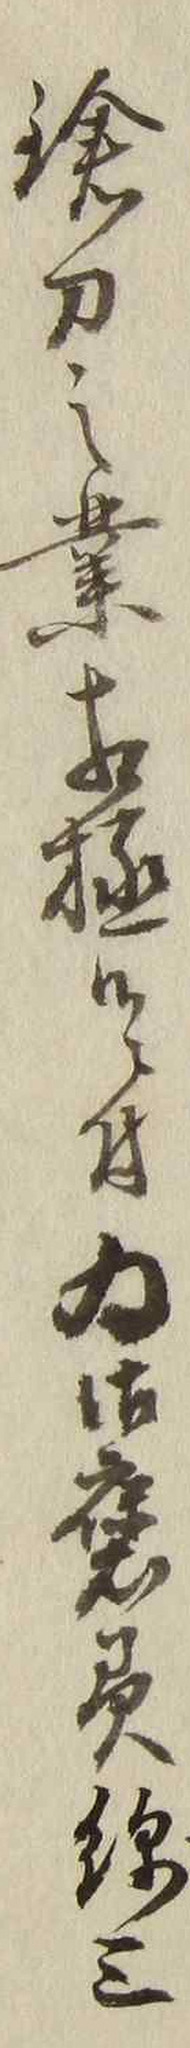鎗刀之業相極候ニ付為御褒美綿三

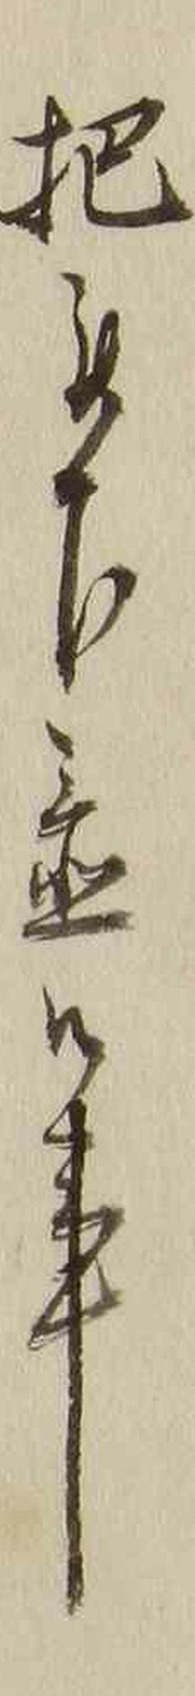把被下置候事
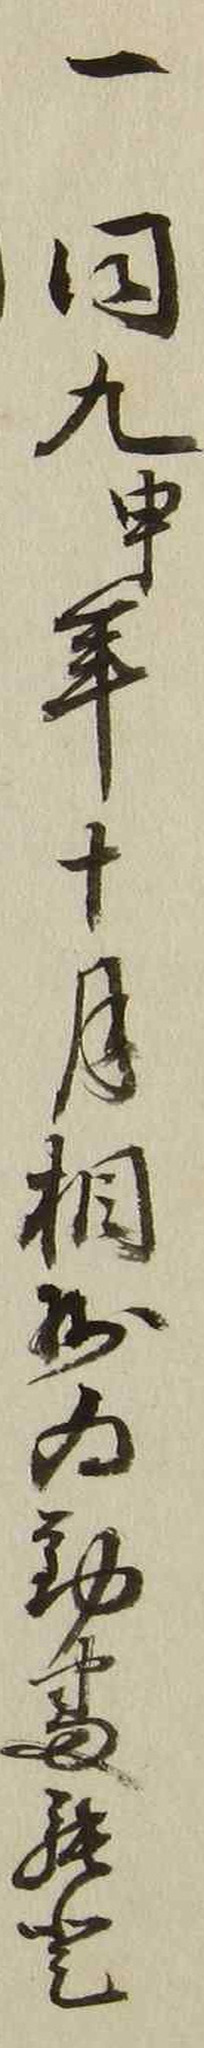一同九申年十月相州為勤番罷登
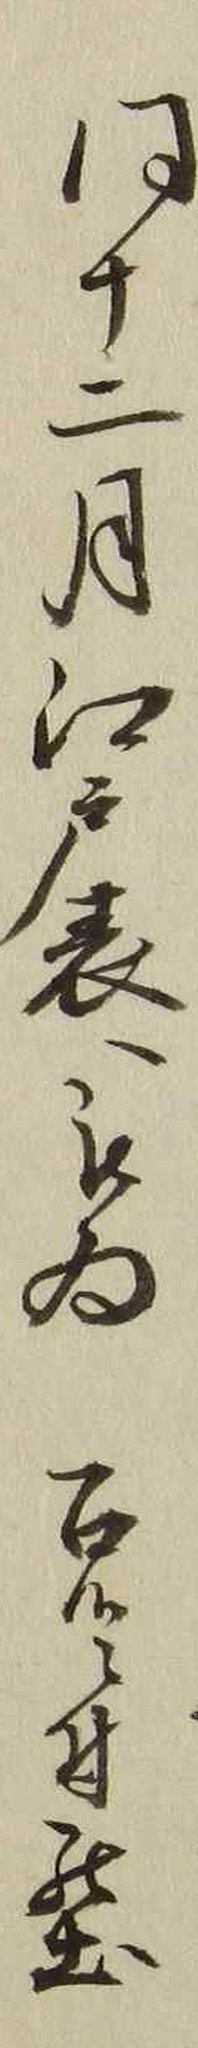同十二月江戸表へ被為召候ニ付罷出
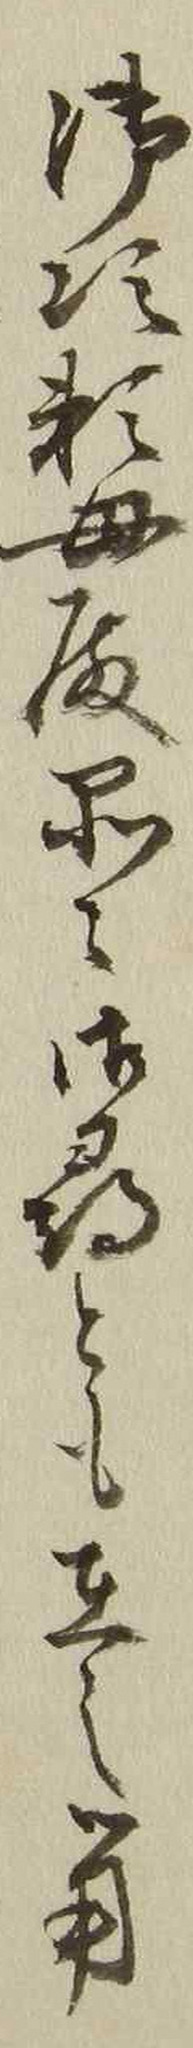御次頼母殿品々御尋とも在之御用
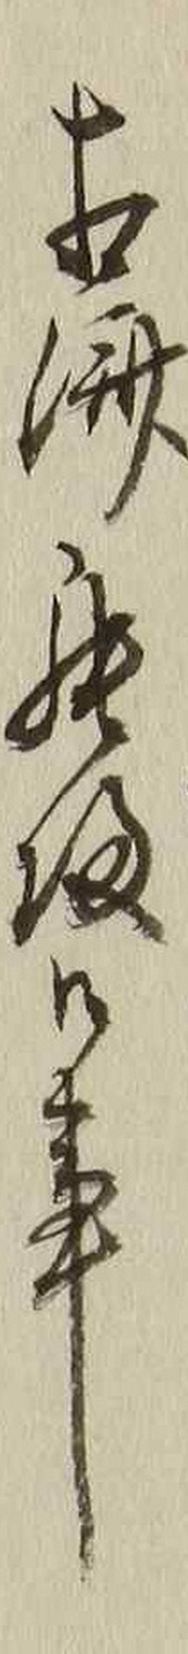相済罷帰候事
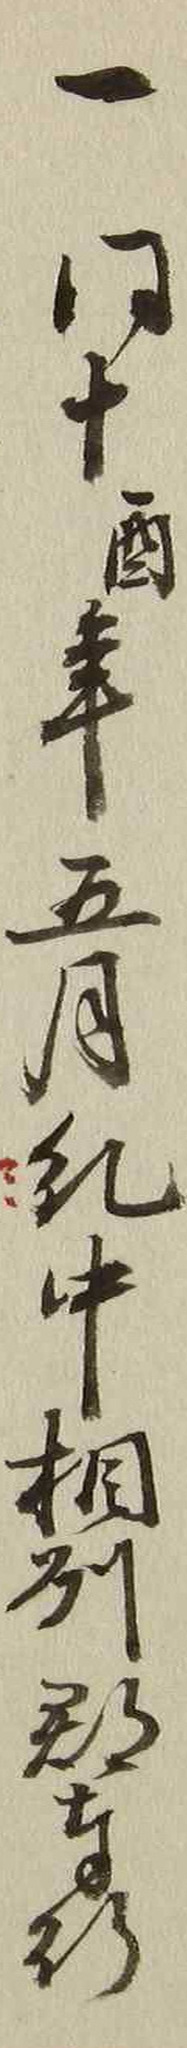一同十酉年五月糺中相州郡奉行
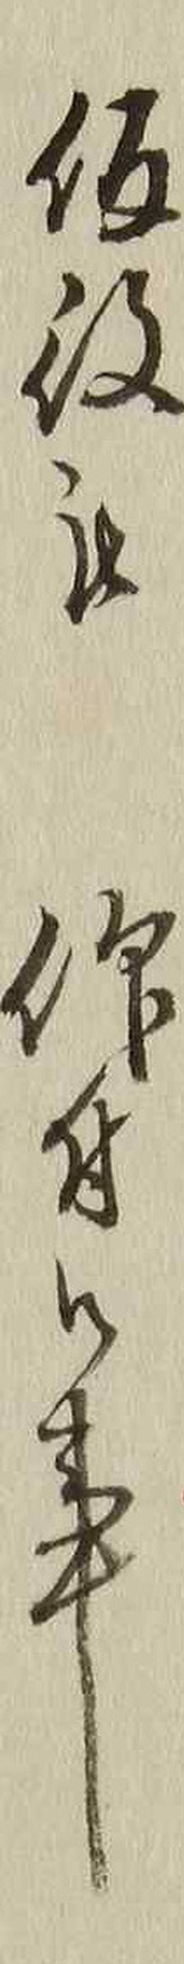仮役被仰付候事
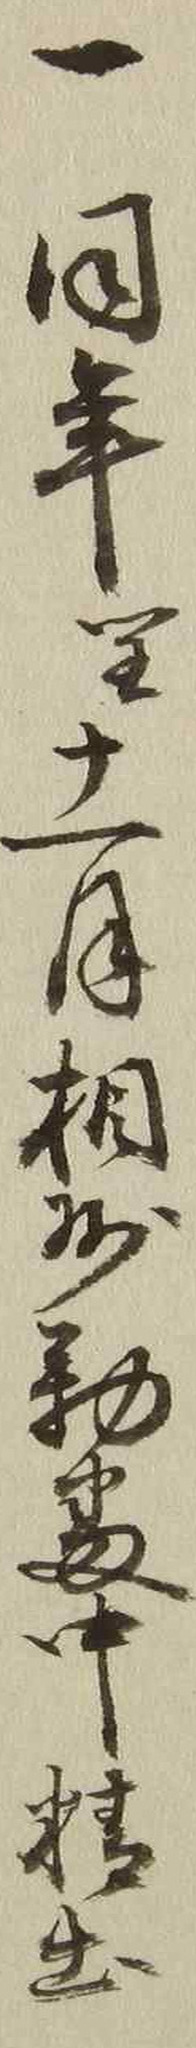一同年閏十一月相州勤番中精出
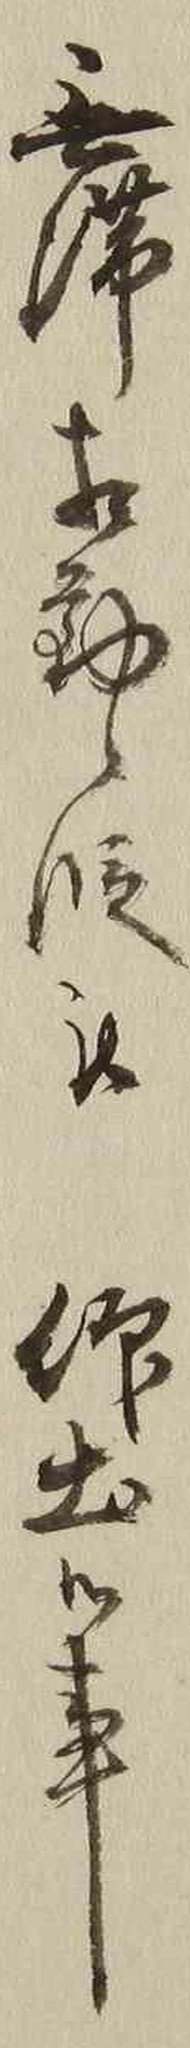無滞相勤候段被仰出候事
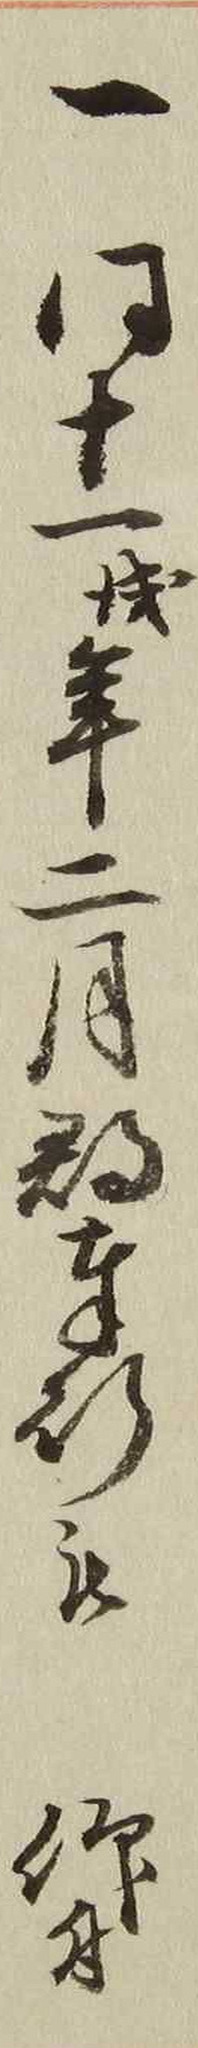一同十一戌年二月郡奉行被仰付
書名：諸士系譜　巻之23　い之部23
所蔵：会津若松市立会津図書館
